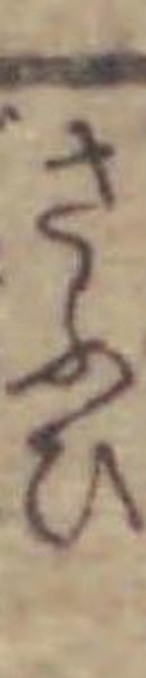さふひ
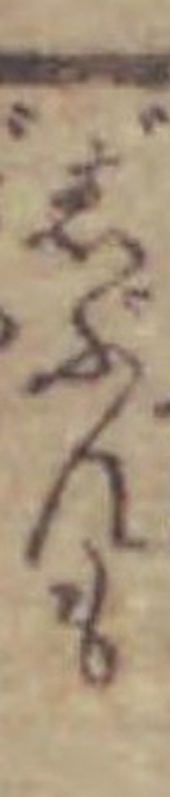じぶんも
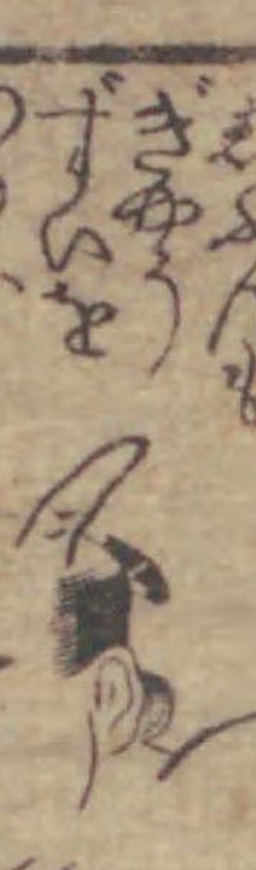ずいを
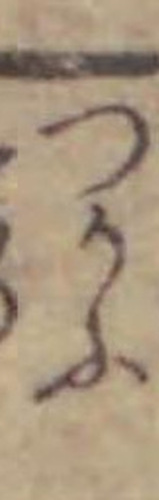つかふ
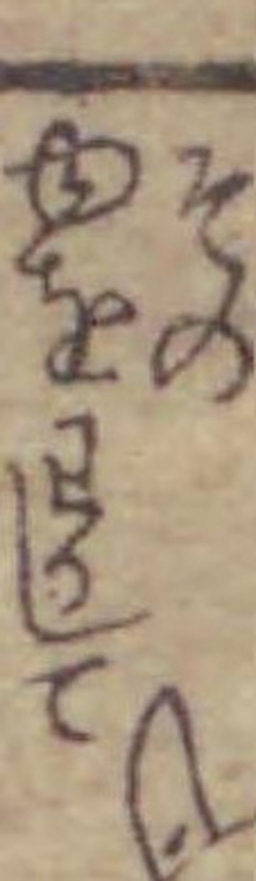ゆをわかして
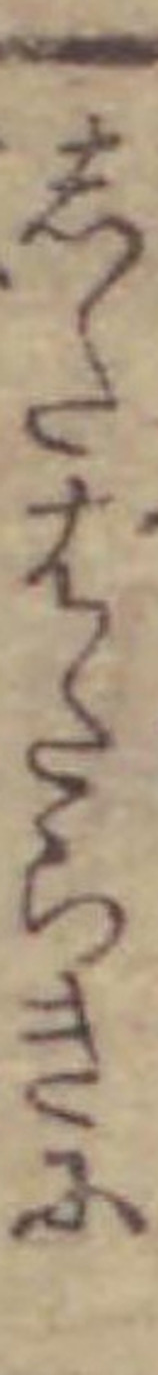したはたらきに
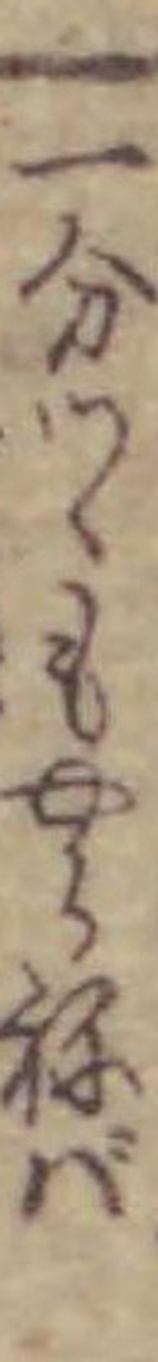一分つゝもやらねば
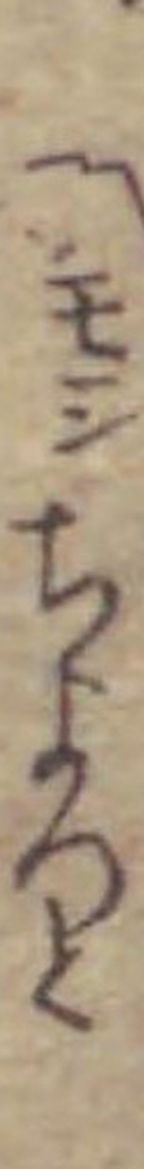「モシちよつと
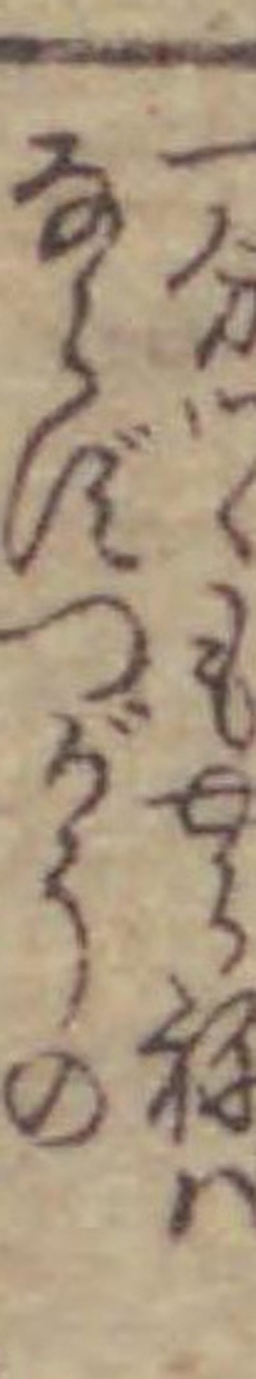ならずつがうの
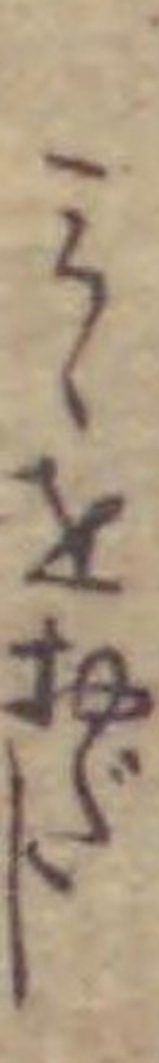みゝをおだし
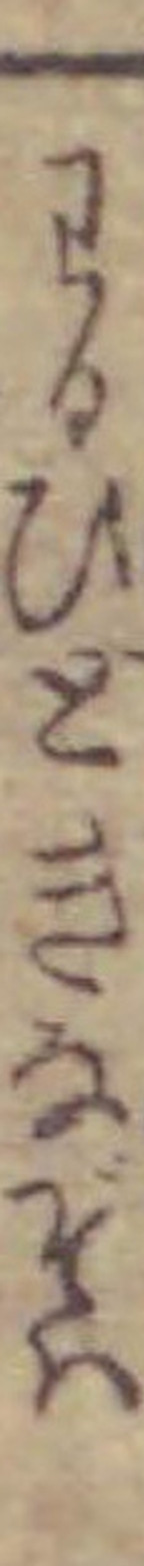わるいときなぞは
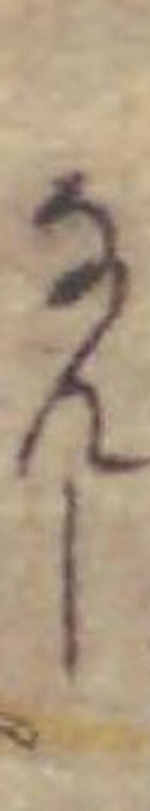なんし
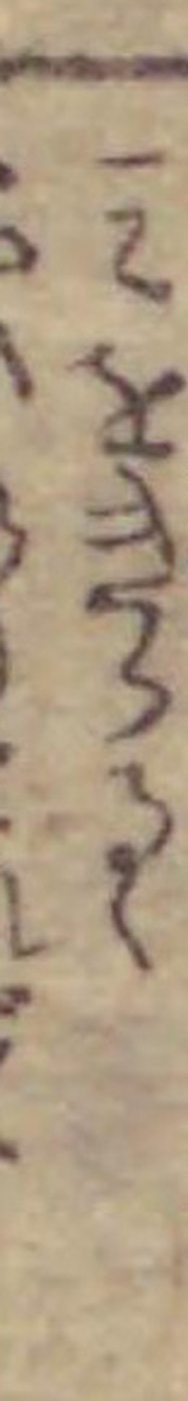みをきらるゝ
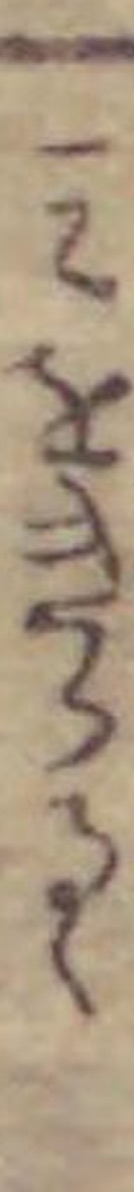みをきらるゝ
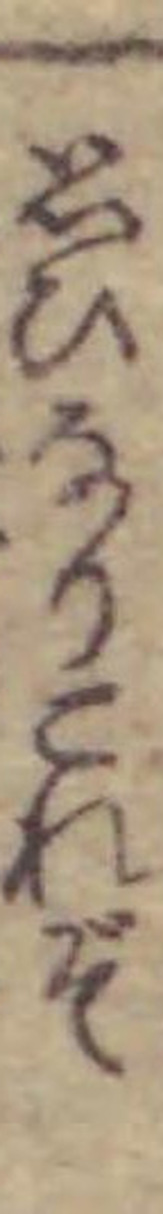思ひなりこれぞ
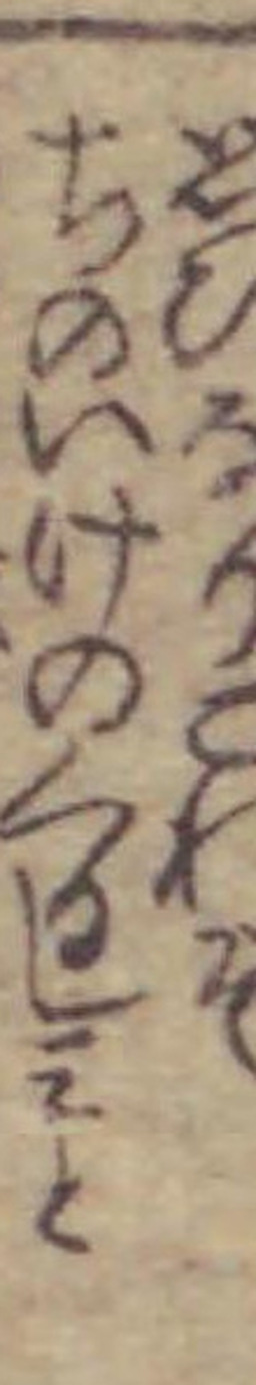ちのいけのくるしみと
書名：九替十年色地獄 : 3巻
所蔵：国立国会図書館 National Diet Library, JAPAN
